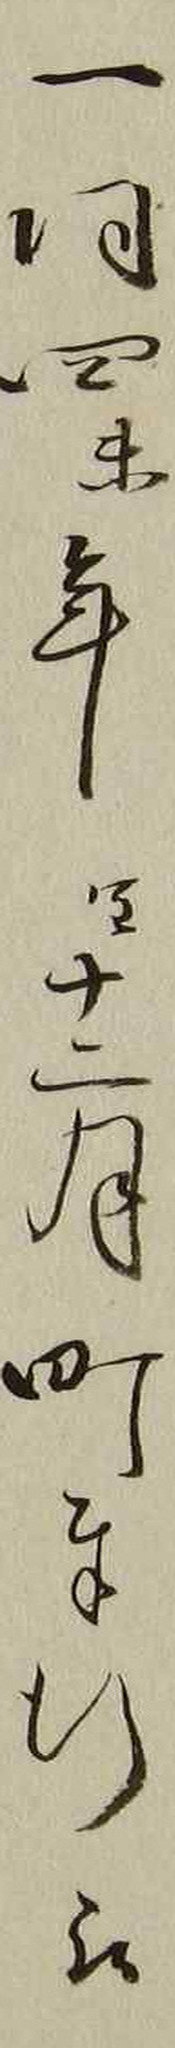一同四未年閏十二月町奉行被
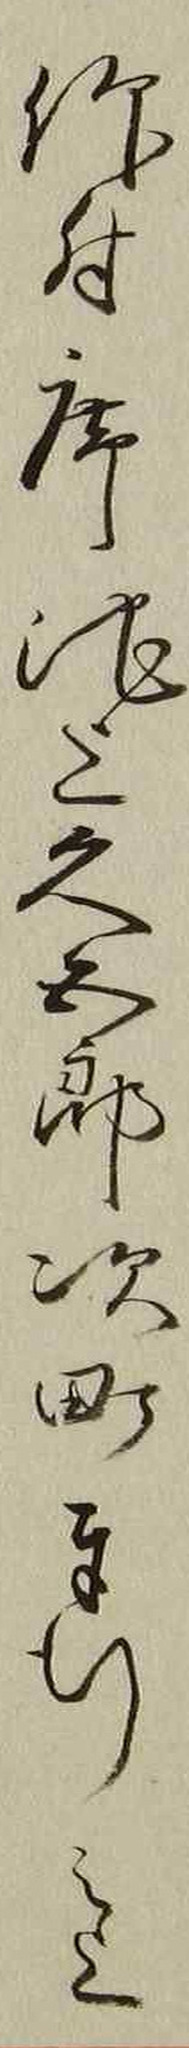仰付席池上久五郎次町奉行之上
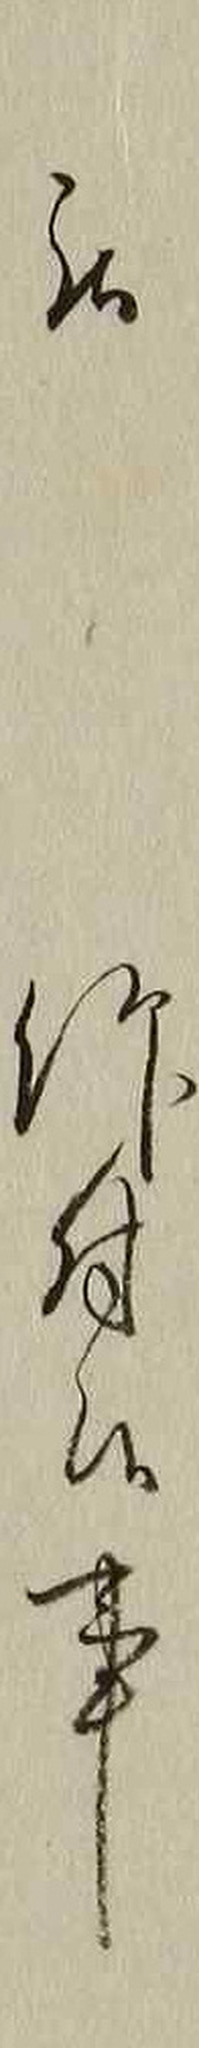被仰付候事
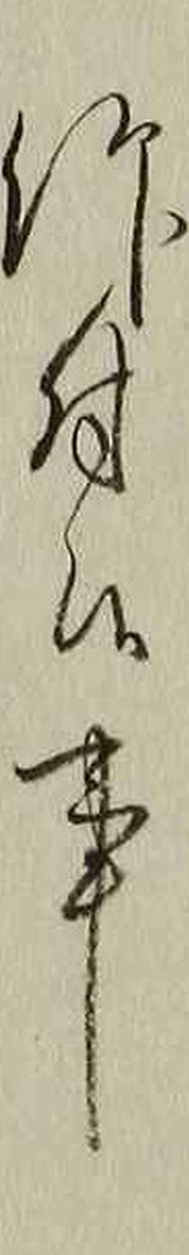仰付候事
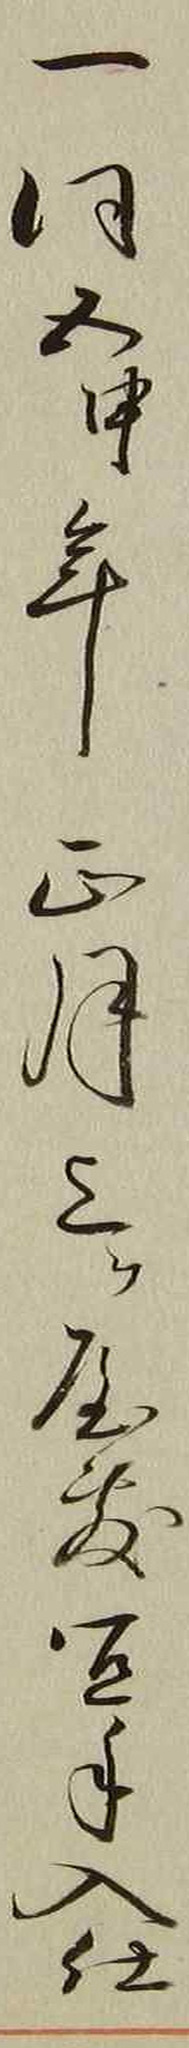一同五申年正月上ケ屋敷宜手入仕
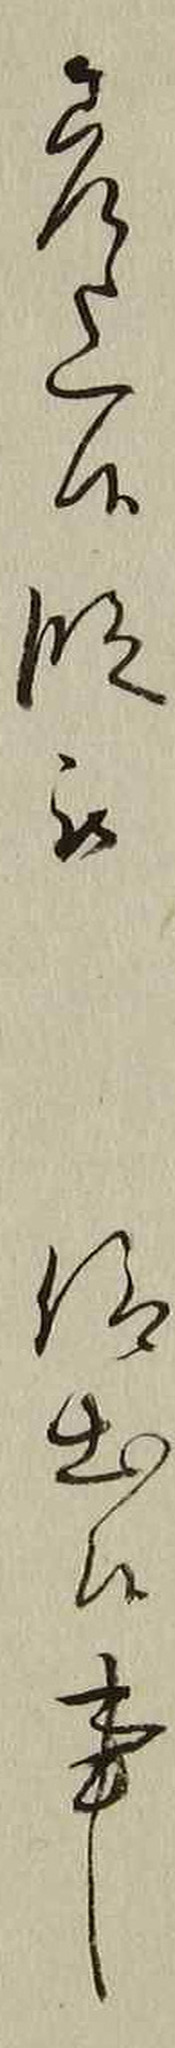差上候段被仰出候事
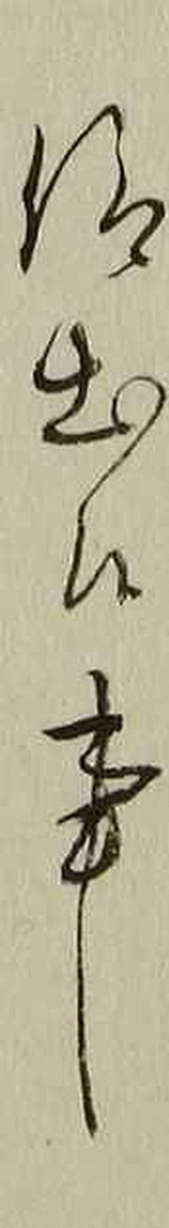仰出候事
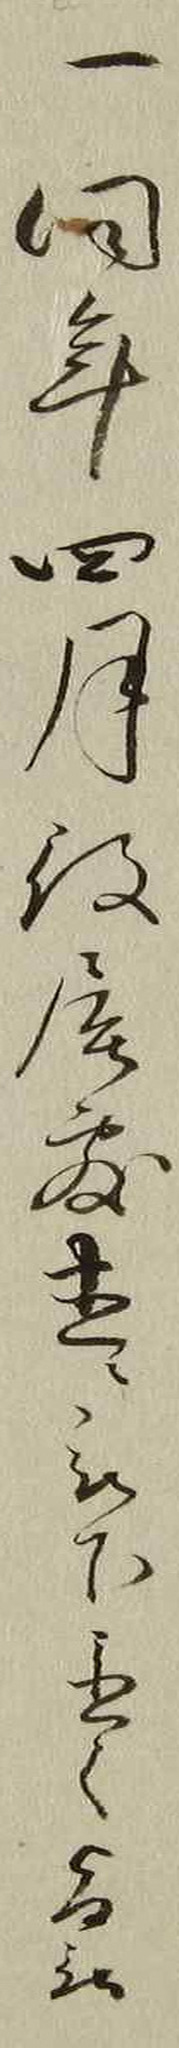一同年四月役屋敷直ニ被下置之旨被
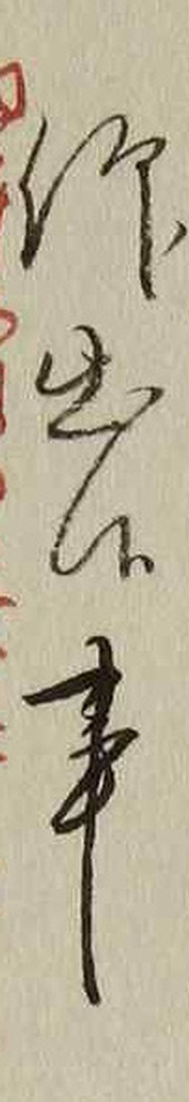仰出候事
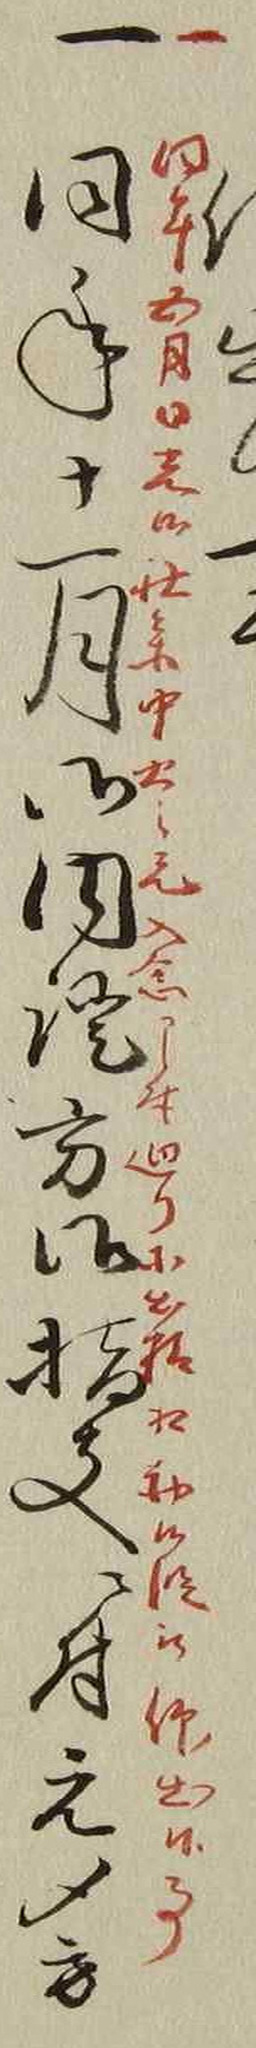一同年十一月御内証方指支ニ付元〆方
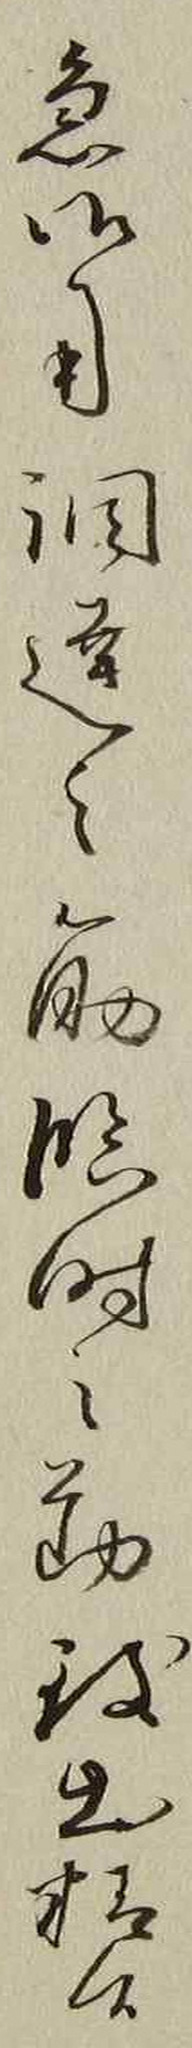急御用調達之筋臨時之勤致出精候
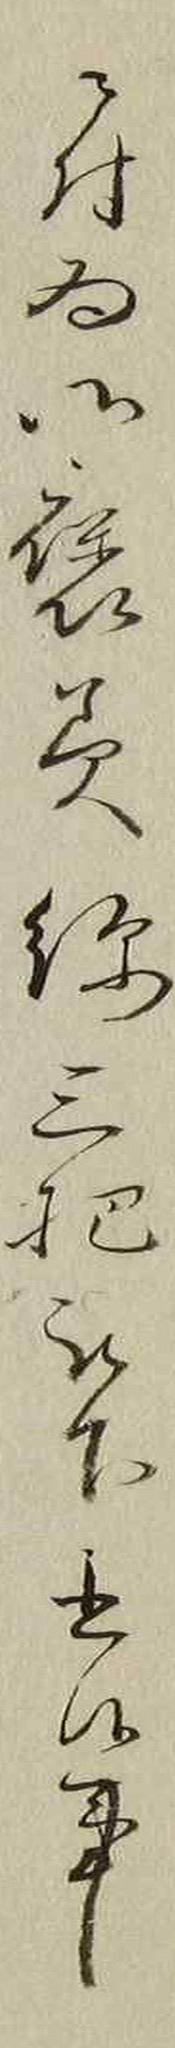ニ付為御褒美綿三把被下置候事
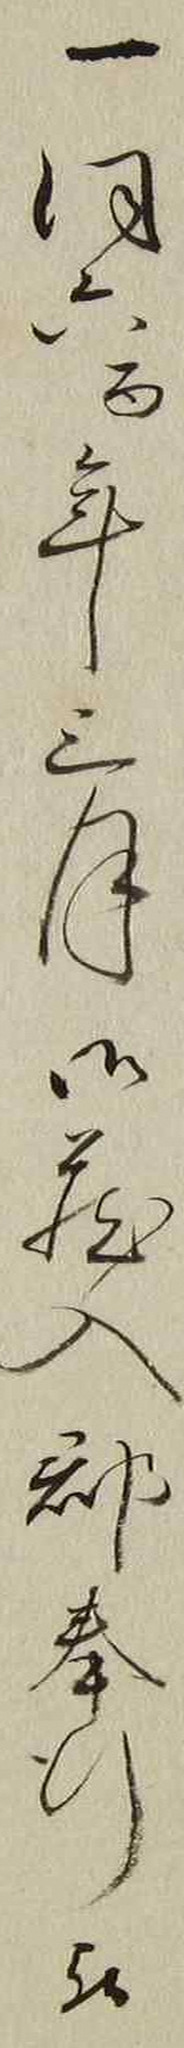一同六酉年三月御蔵入郡奉行被
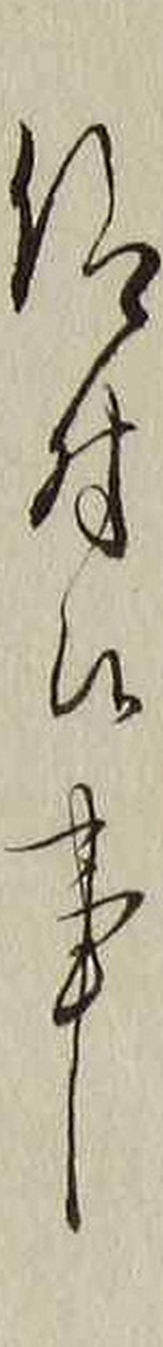仰付候事
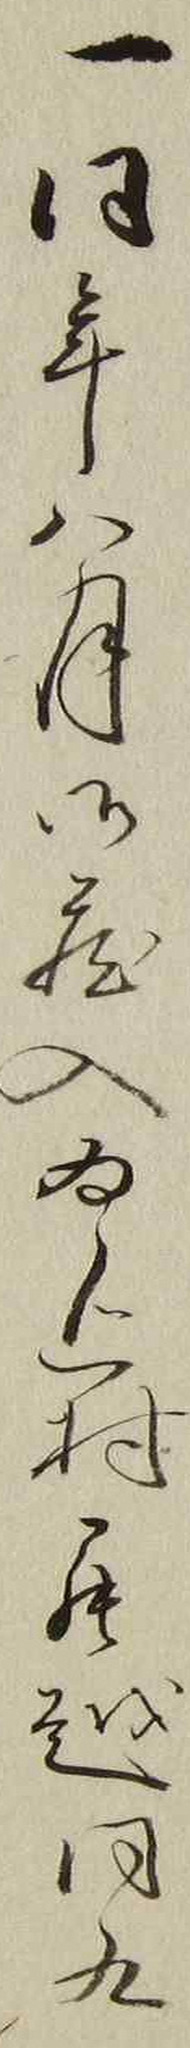一同年八月御蔵入為上村罷越同九
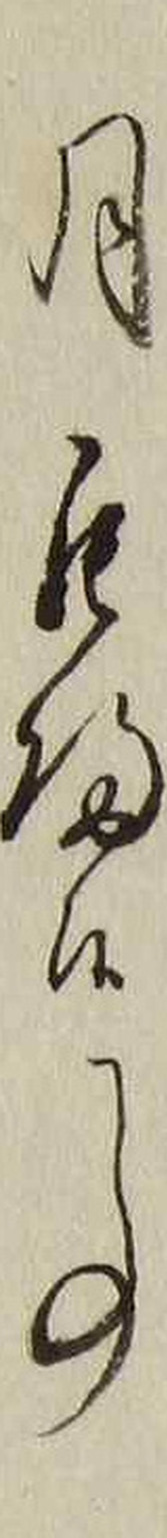月罷帰候事
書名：諸士系譜　巻之2　い之部2
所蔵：会津若松市立会津図書館
